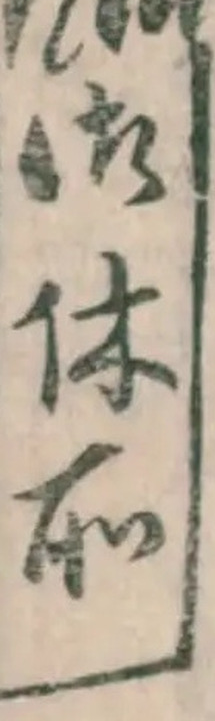御休所
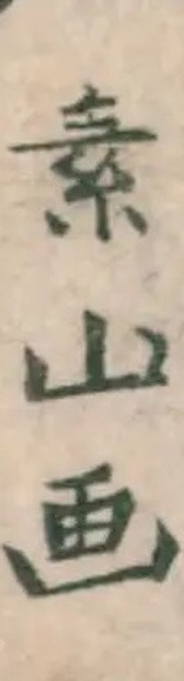素山画
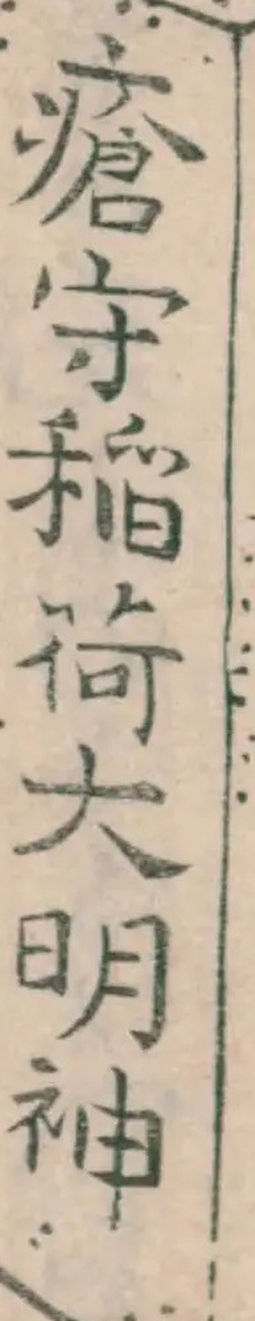瘡守稲荷大明神

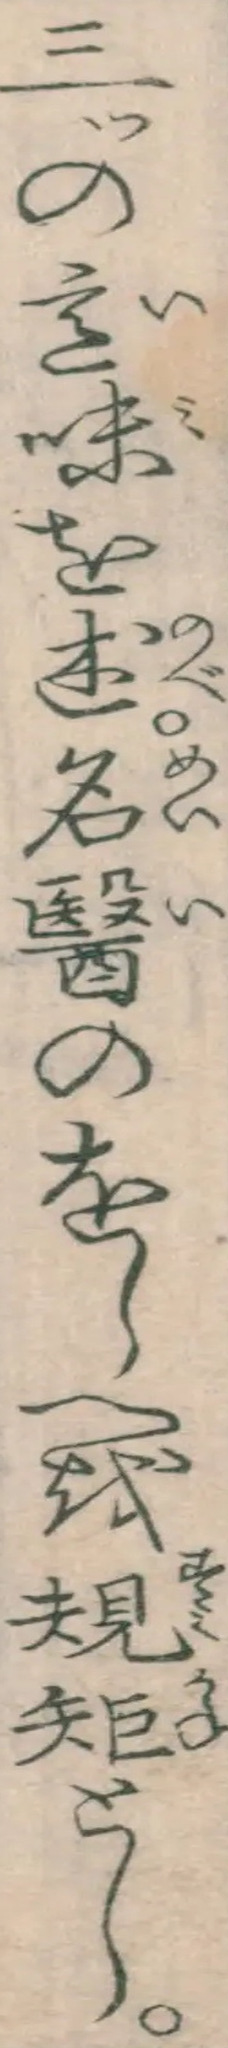三ツの意味を述。名醫のをしへを規矩とし。
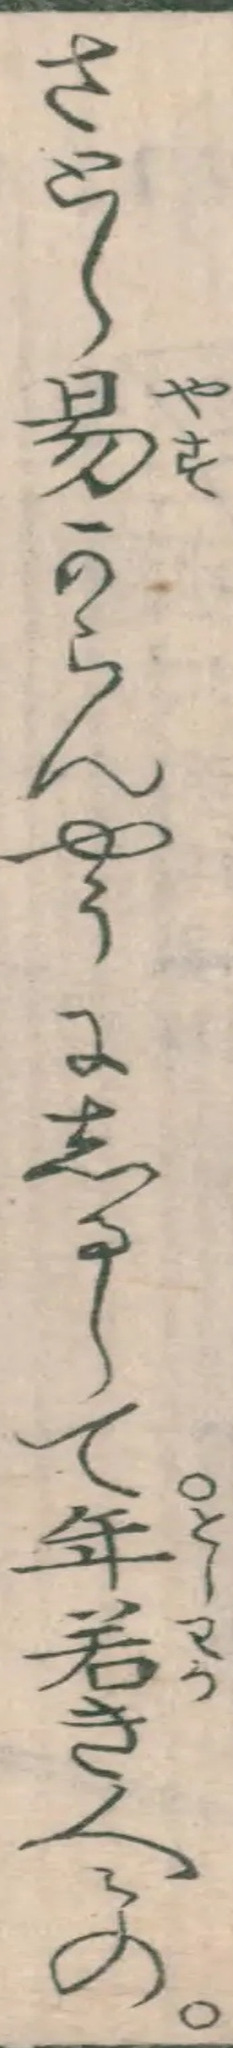さとし易からんやうにしるして。年若き人々の。
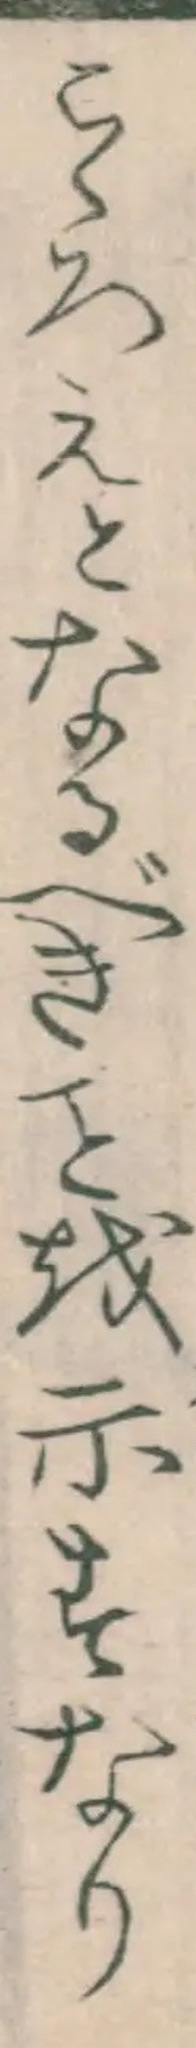こゝろえとなるべきことを示すなり
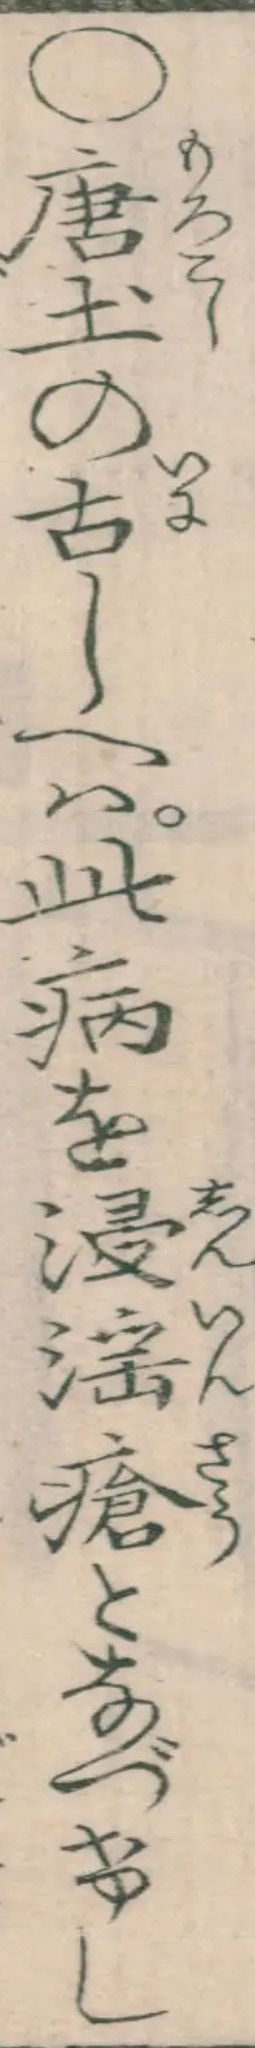〇唐土の古しへは。此病を侵入淫瘡となづけし
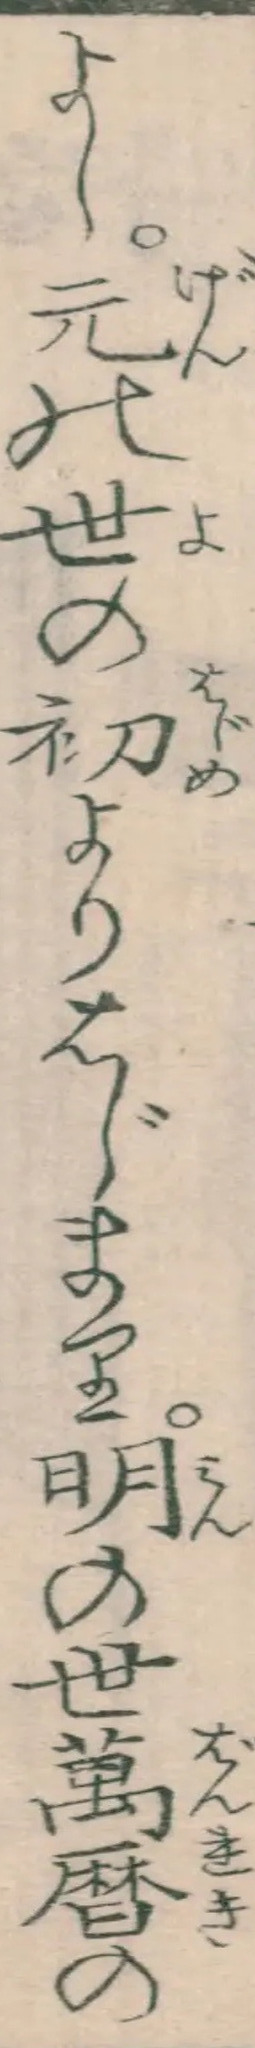よし。元の世の初よりはじまり。明の世萬暦の
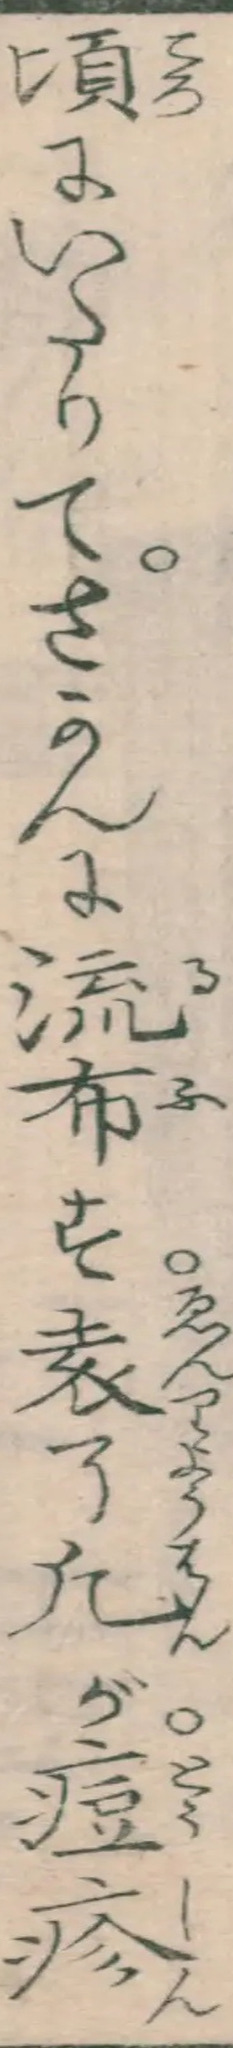頃にいたりて。さかんに流布す。袁了凡が。痘疹
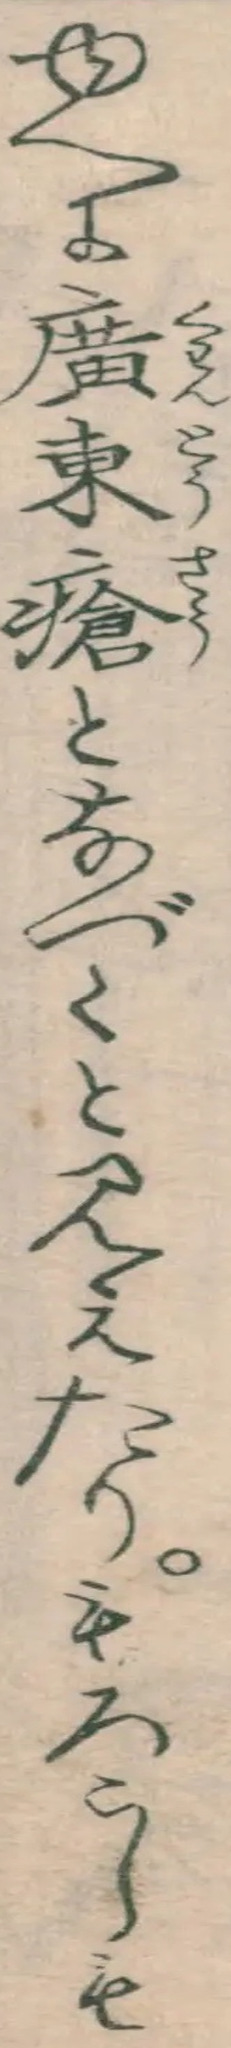ゆへに広東瘡となづくと見えたり。もろこしも
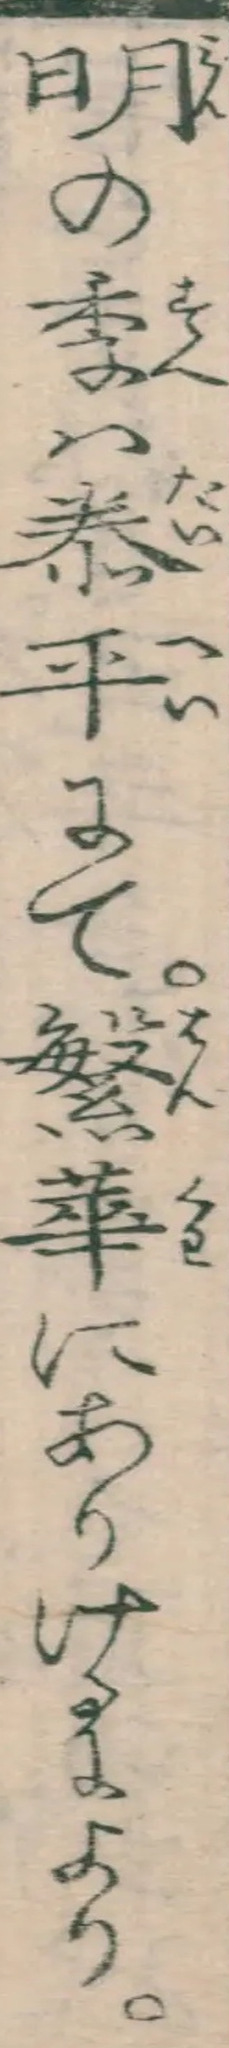明の季は泰平にて。繁華にありけるにより。
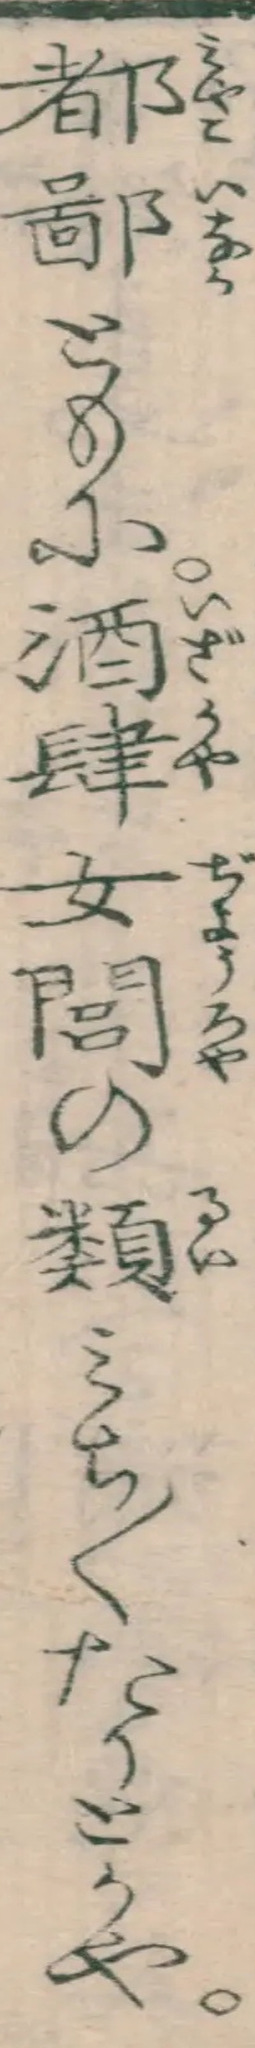都鄙ともに。酒肆女閭の類みち〳〵たりとうや。
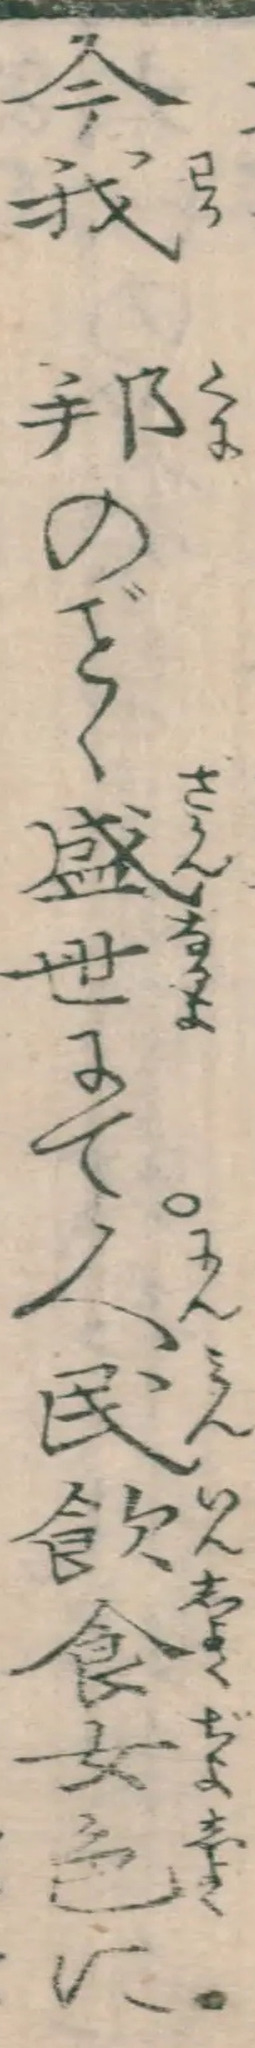今我邦のごとく盛世にて。人民飲食女色に・
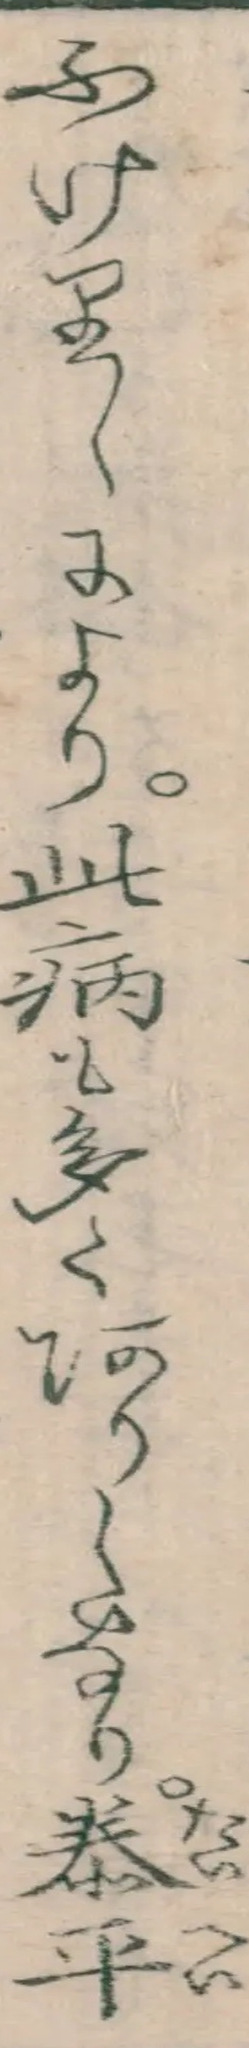ふけりしにより。此病も多くありしなり。泰平
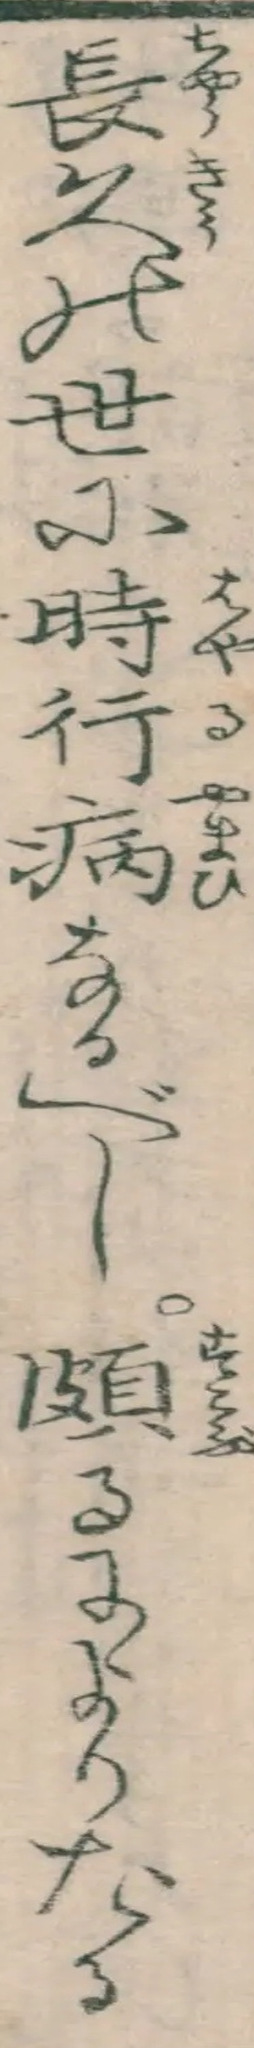長久の世に時行病なるべし。頗るによりたる
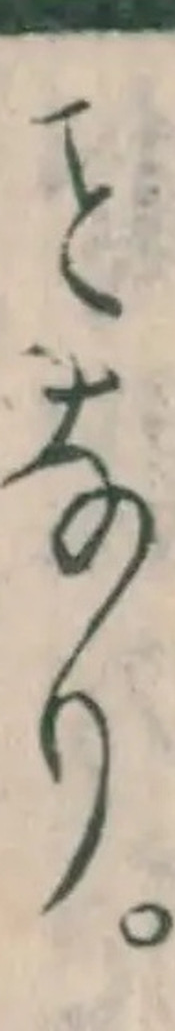ことなり。
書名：瘡家示訓
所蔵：国立国会図書館 National Diet Library, JAPAN
